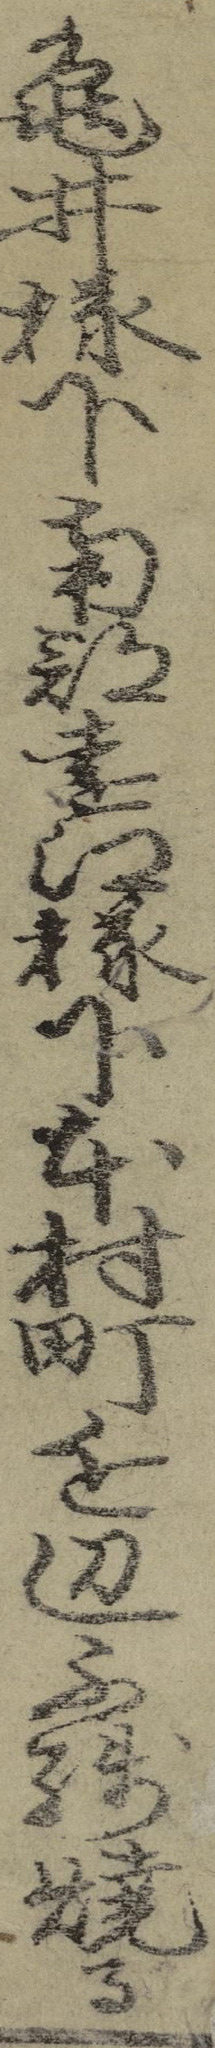亀井様下南部遠江様下本村町近辺不残焼る
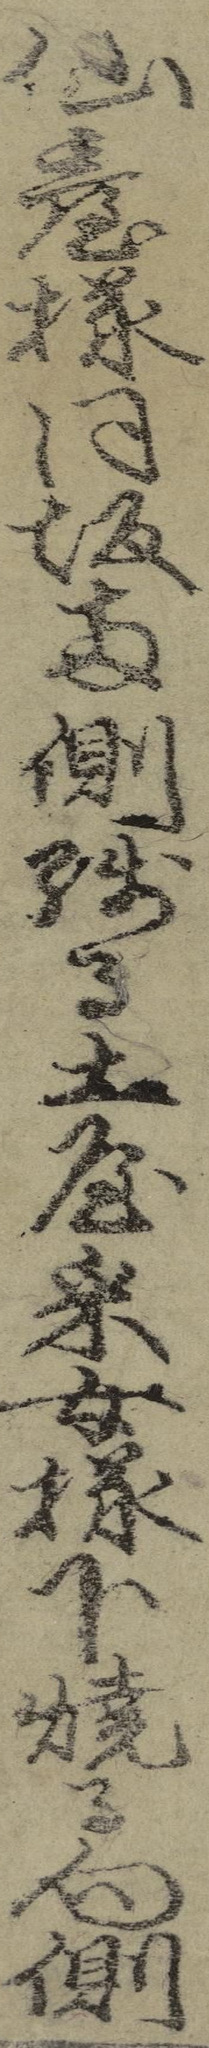仙台様同坂南側残る土屋采女様下焼る向側
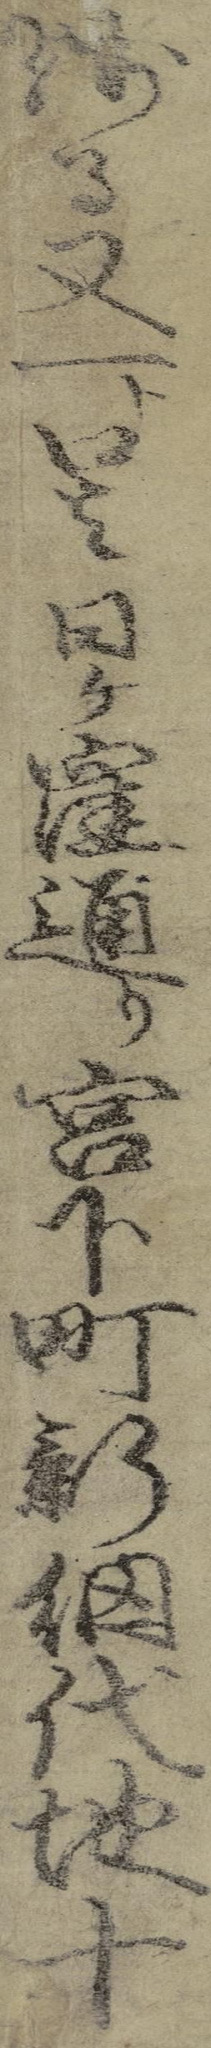残る又一口は日ケ窪通り宮下町新佃代地十
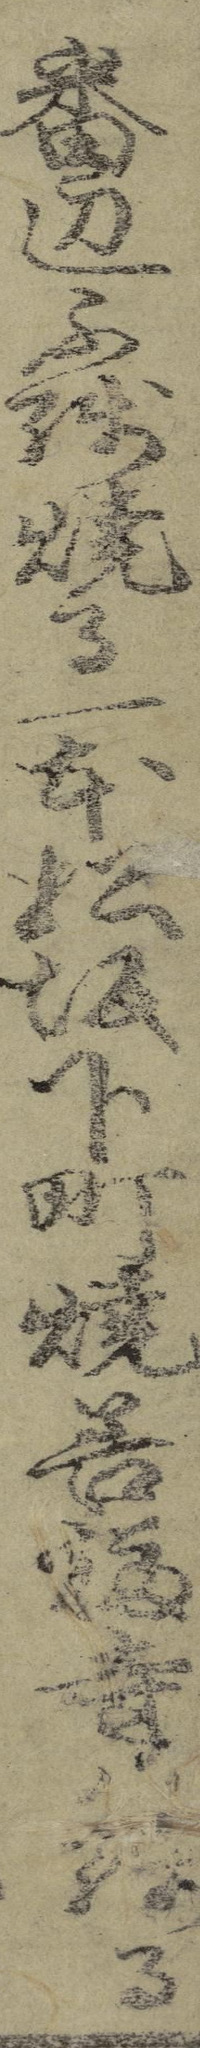番辺不残焼る一本松坂下町焼善福寺は残る
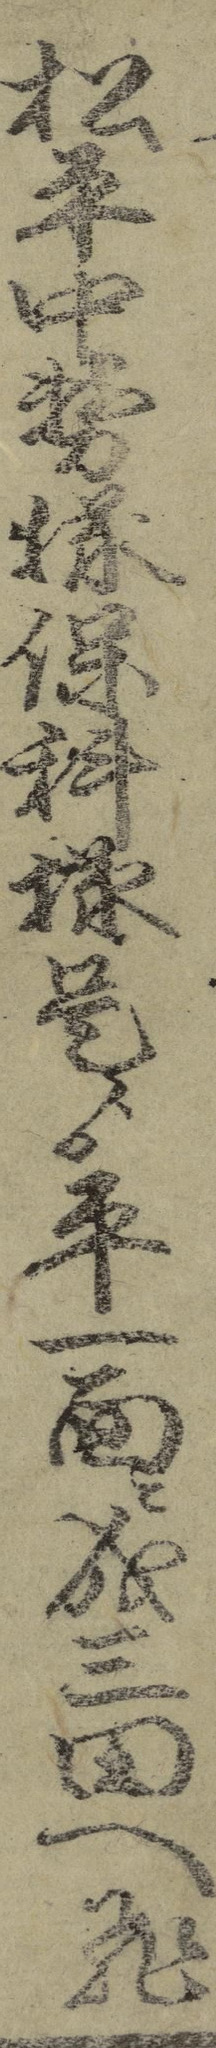松平中務様保科様是ゟ平一面成三田へ飛
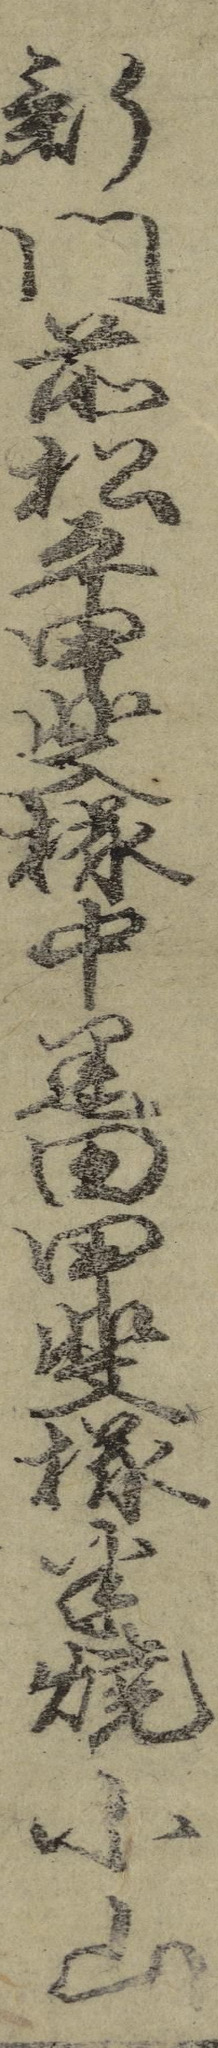新門前松平甲斐様中運田甲斐様半焼小山
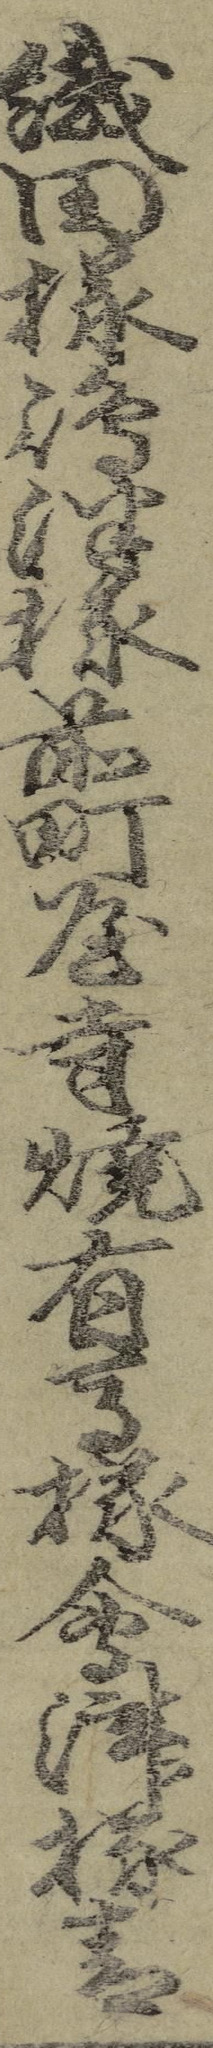織田様嶋津様前町屋寺焼有馬様会津様青
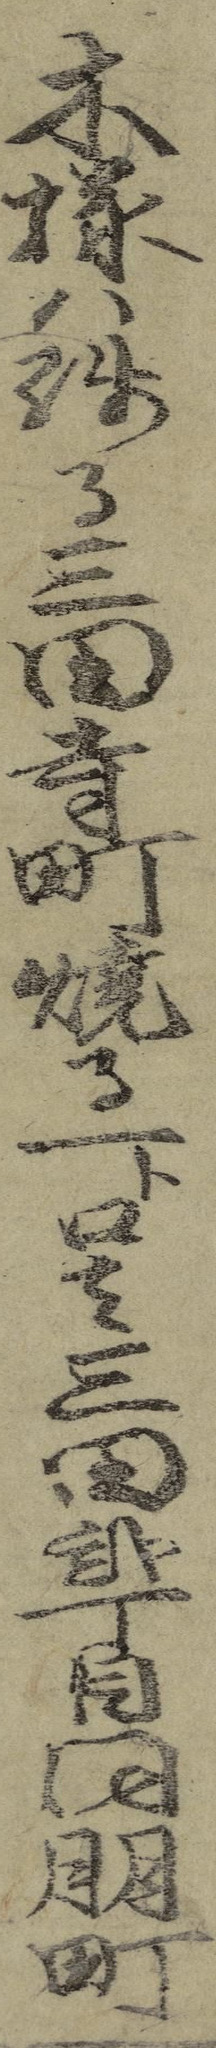木様は残る三田寺町焼る一口は三田弐丁目同朋町
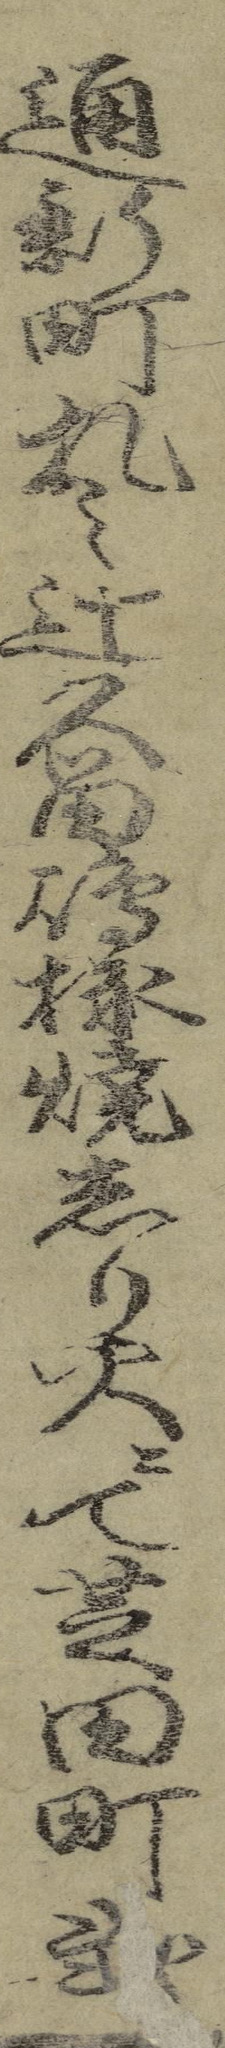通り新町札之辻久留嶋様焼しり火芝田町弐
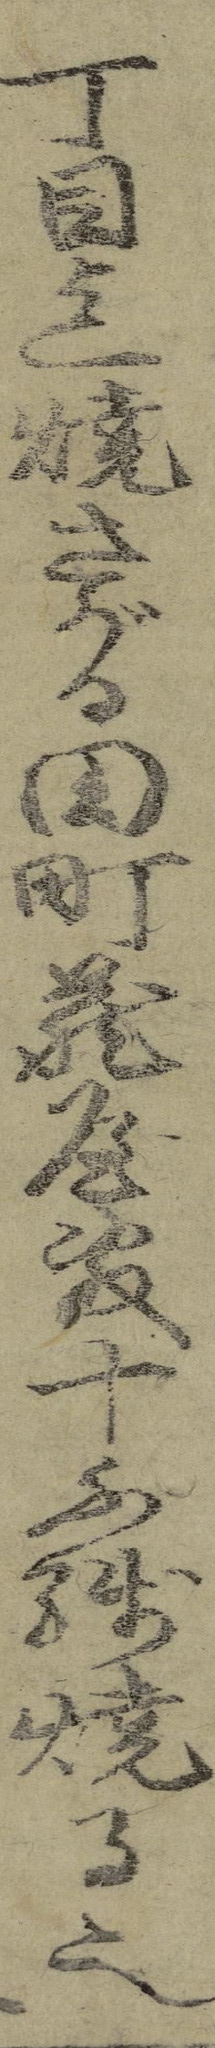丁目迄焼さがる田町蔵屋敷十不残焼る也
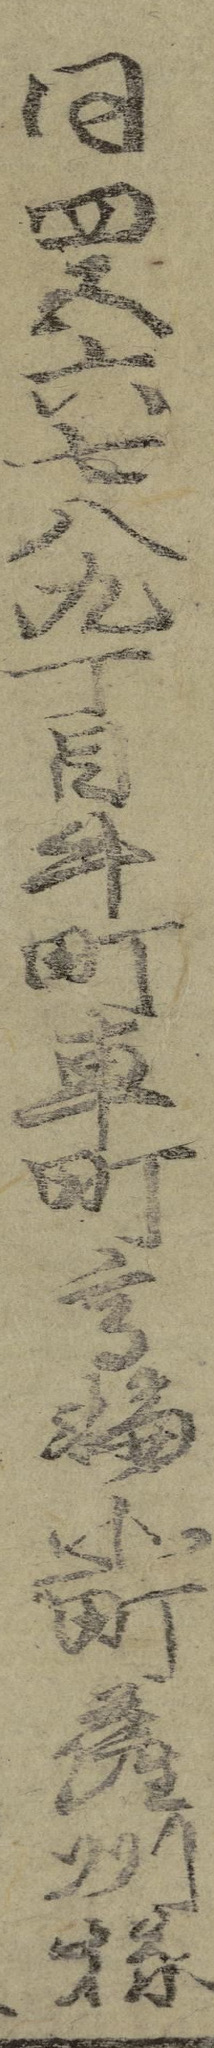同四五六七八九丁目牛町車町高輪北町薩州様
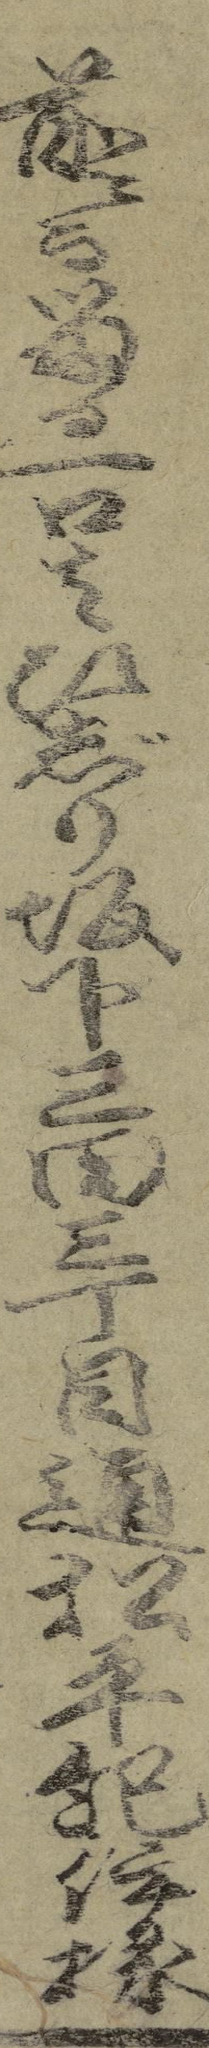前而留る一口はひじり坂下三田三丁目通松平紀伊様
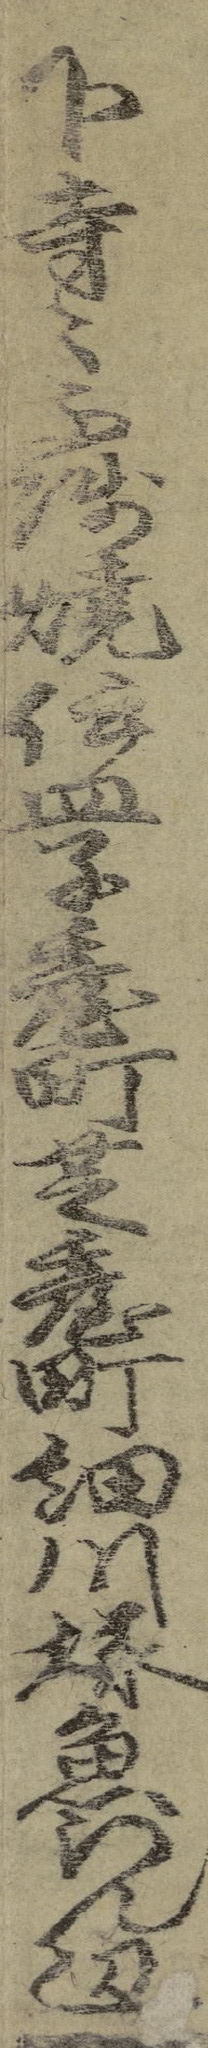下寺〻不残焼伊皿子台町芝台町細川様魚えん辺
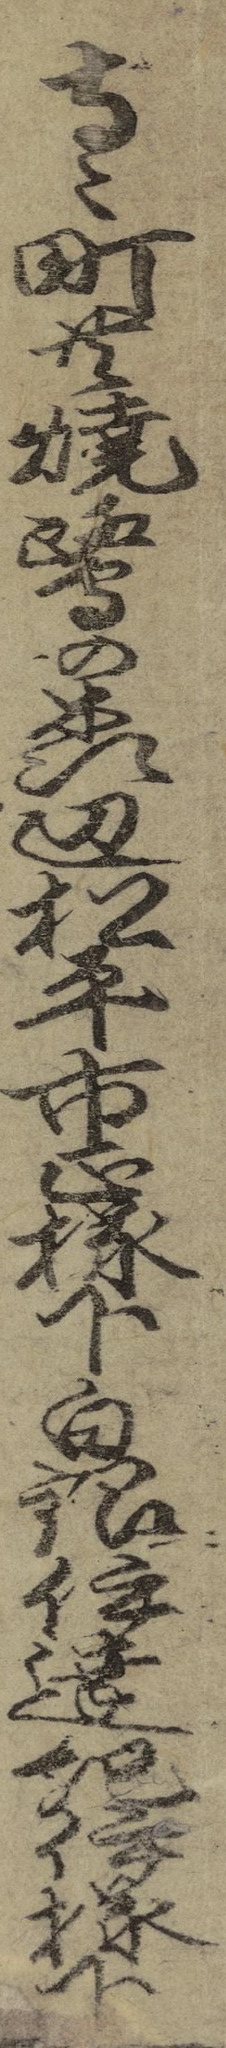寺〻町共焼鷺の森辺松平市正様下白銀伊達紀伊様下
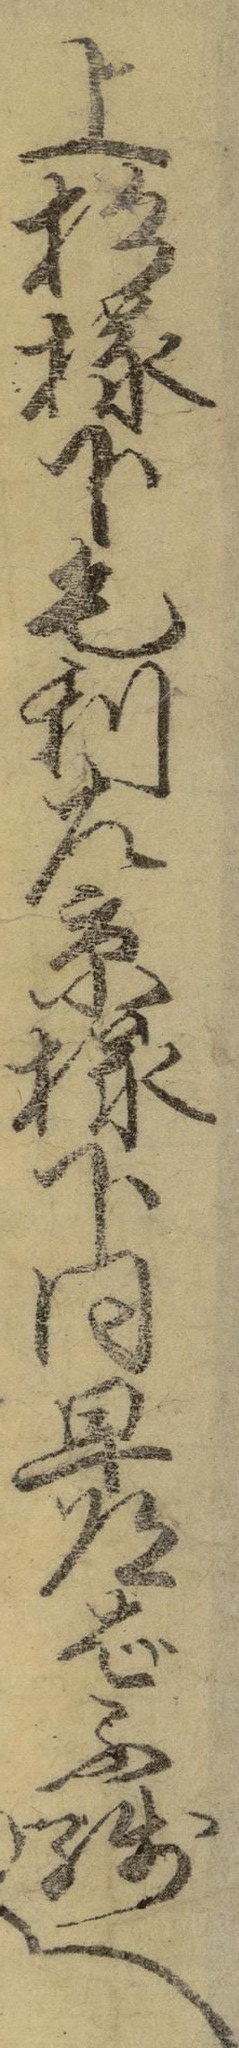上杉様下毛利左京様下同早道は不残
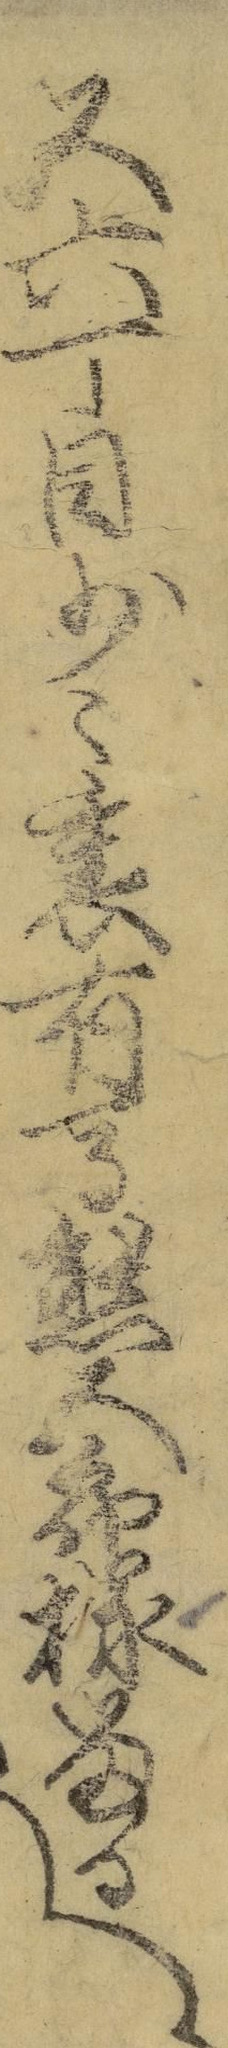五六丁目少〻裏有馬熊五郎様留る
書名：[弘化二年正月の江戸大火に関する瓦版]
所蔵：東京大学地震研究所図書室 Earthquake Research Institute Library, The University of Tokyo, JAPAN
